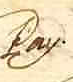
Pay.
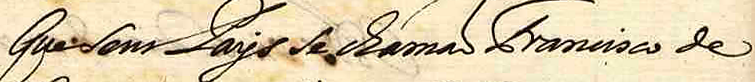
Que seus Pays se chamaõ Francisco de
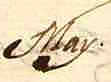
May.
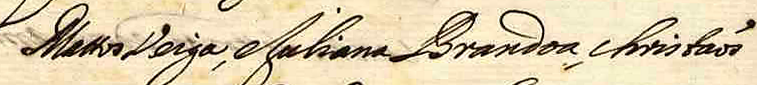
Mattos Veiga, e Juliana Brandoa, christaõs
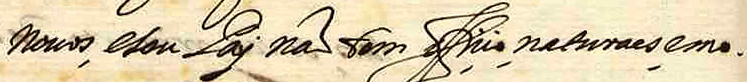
nouos, e seu Pay naõ tem officio, naturaes e mo
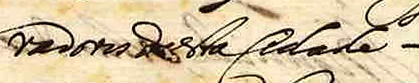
radores desta Cidade
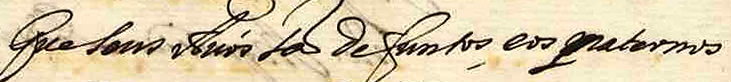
Que Seus Auós saõ defuntos, e os paternos
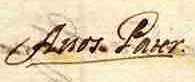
Auos Pater.
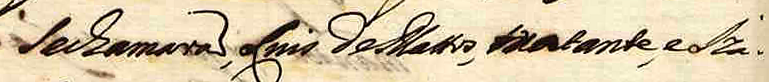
se chamaraõ, Luis de Mattos, tratante, e Iza
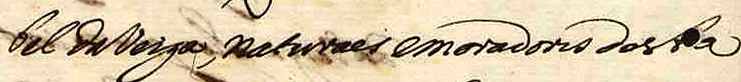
bel da Veiga, naturaes e moradores desta
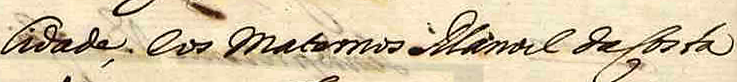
Cidade, e os maternos Manoel da Costa
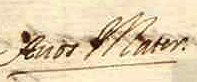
Auos Mater.
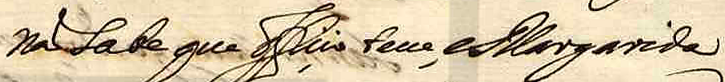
naõ Sabe que officio teue, e Margarida
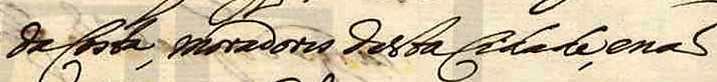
da Costa, moradores desta Cidade, e naõ
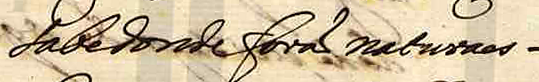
Sabe donde foraõ naturaes
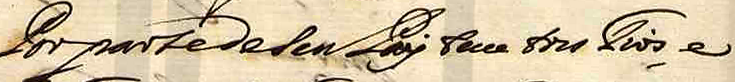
Por parte de seu Pay teue tres Tios, e
